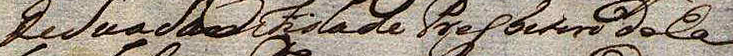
de sua sanctidade Presbetero do ha
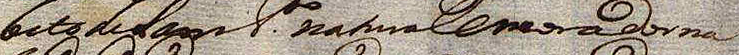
bito de Sam P.do natural e morador na
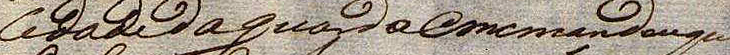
Cedade da guarda e me mandou que
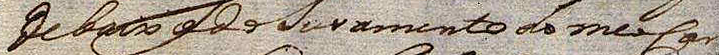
debaixo do Iuramento do meo Car
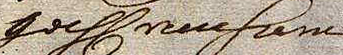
go esCreuessem
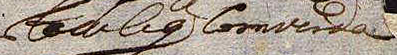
a deleg.a Com verda
